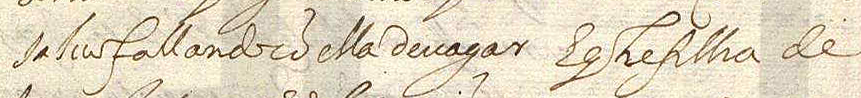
saluo fallando cō ella deuagar E q̄ he filha de
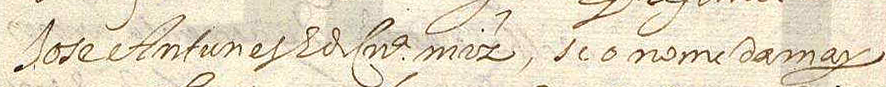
Ioze Antunes E d Cna. miz̄, se o nome da may
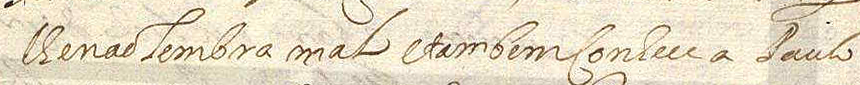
lhe naõ lembra maL e tambem Conhece a Paulo
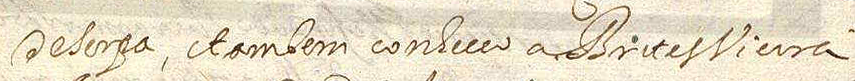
de Serpa, e tambem conheceo a Brites Vieira
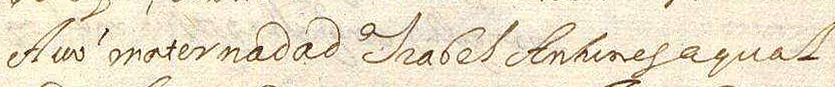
Auó materna da da Izabel Antunes a qual
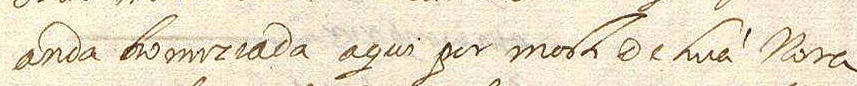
anda homiziada aqui por morte de huā nora
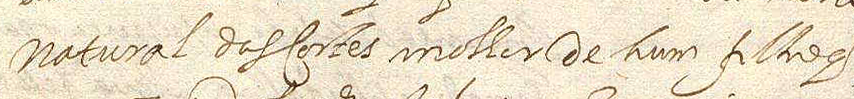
natural das Cortes molher de hum filho q̄
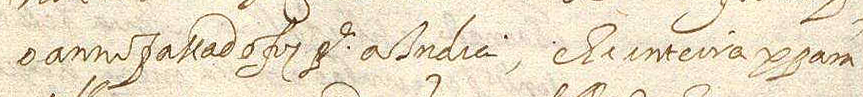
o anno passado foy p.a a India; e he inteira xpam̄
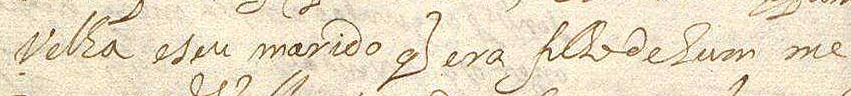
velha e seu marido q̄ era filho de hum me
